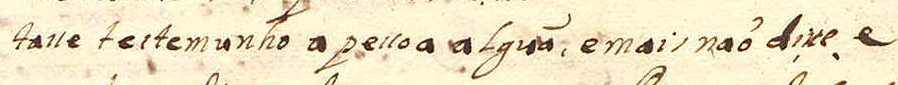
tasse testemunho a pessoa alguā, e mais naõ disse, e
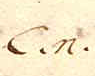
C. n.
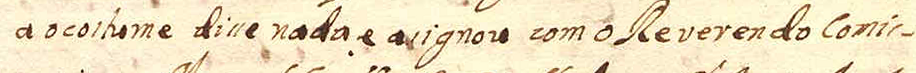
ao costume disse nada e asignou com o Reverendo comis
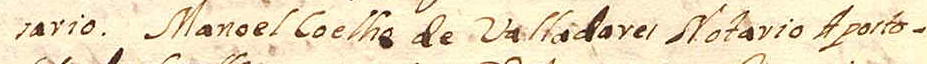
sario. Manoel Coelho de Valladares Notario Aposto
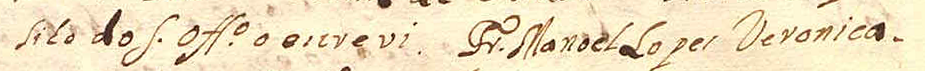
lico do S. off.o o escrevi. Fr. Manoel Lopes Veronica.
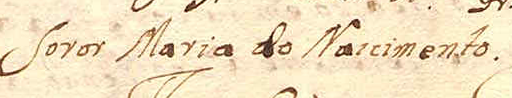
Soror Maria do Nascimento.
